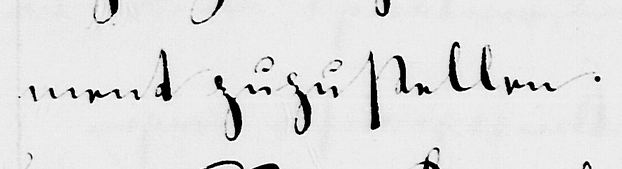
ment zuzustellen.
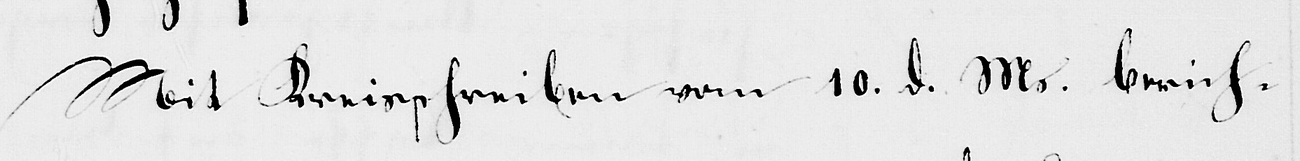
Mit Kreisschreiben vom 10. d. Ms. berich¬
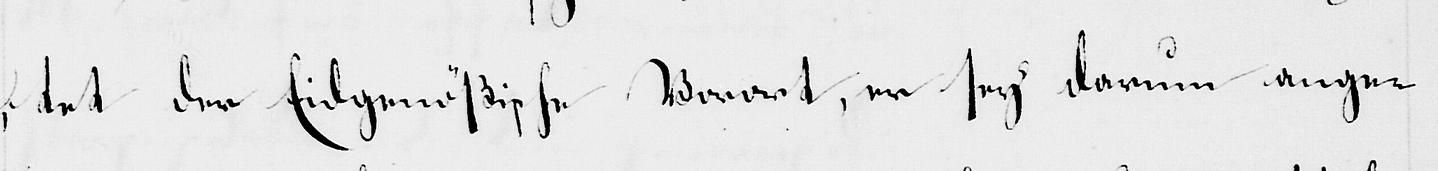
tet der Eidgenößische Vorort, er sey darum ange¬
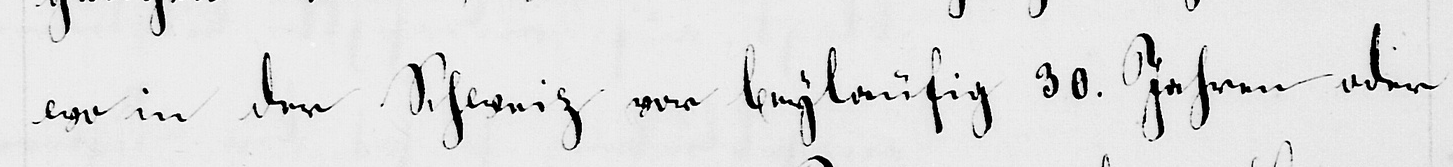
wo in der Schweiz vor beyläufig 30. Jahren oder
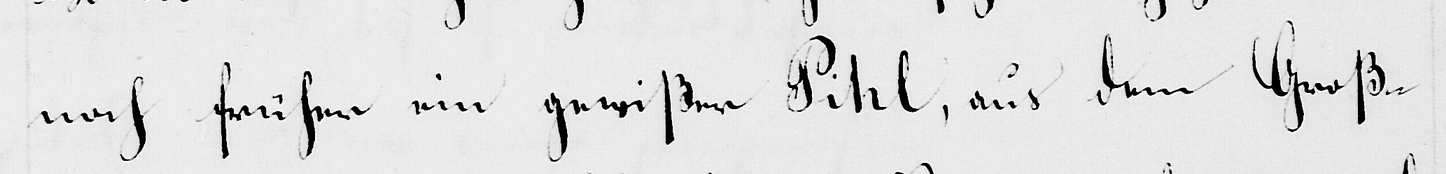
noch früher ein gewißer Pihl, aus dem Groß¬
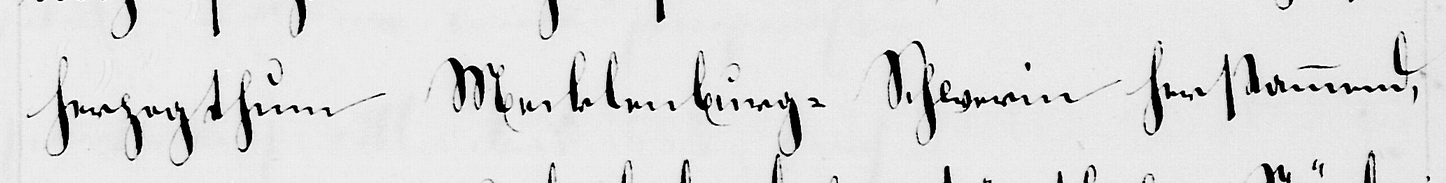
herzogthum Mecklenburg-Schwerin herstammend,
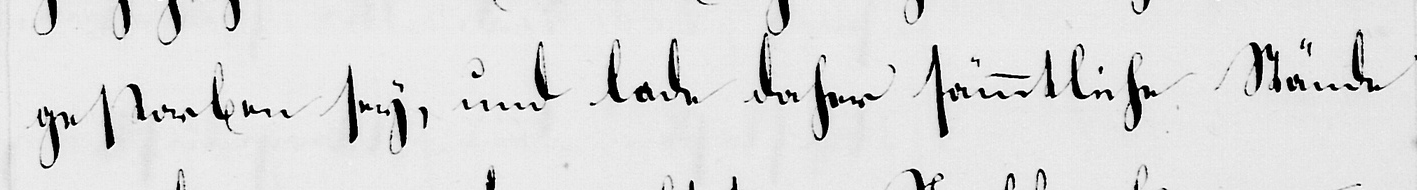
gestorben sey, und lade daher sämmtliche Stände
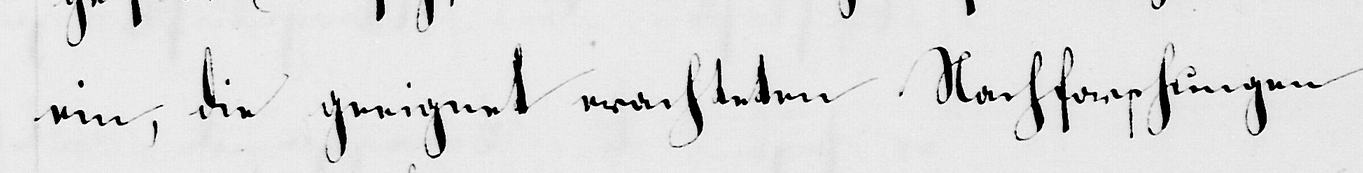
ein, die geeignet erachteten Nachforschungen
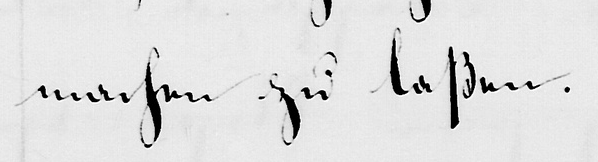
machen zu laßen.
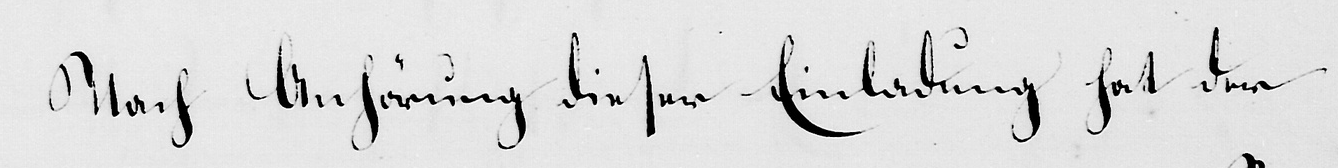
Nach Anhörung dieser Einladung hat der
